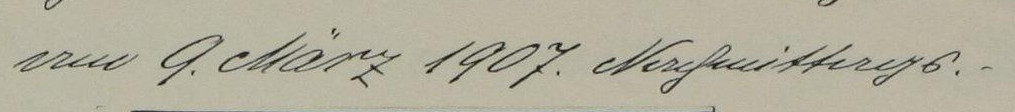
am 9. März 1907. Nachmittags.
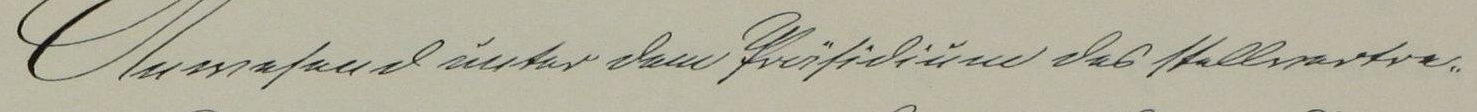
Anwesend unter dem Präsidium des stellvertre-
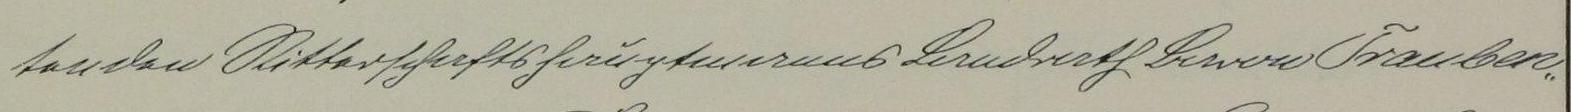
tenden Ritterschaftshauptmanns Landrath Baron Trauben-
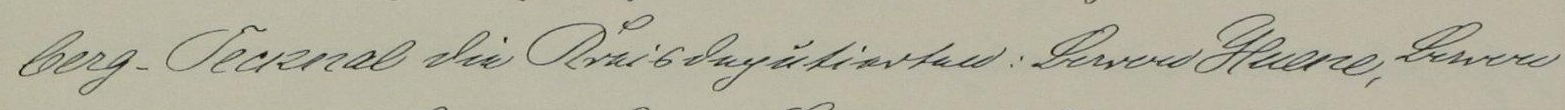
berg-Tecknal die Kreisdeputierten: Baron Huene, Baron
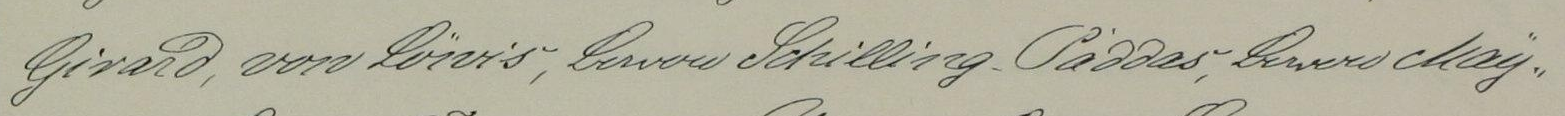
Girard, von Löwis, Baron Schilling-Paddas, Baron May-
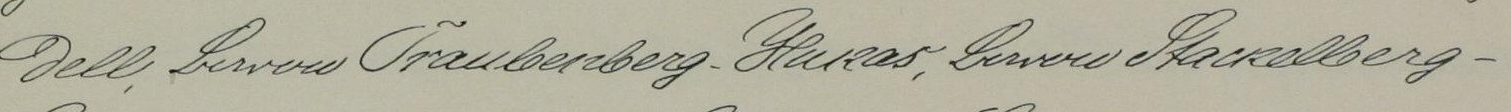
dell, Baron Traubenberg-Hukas, Baron Stackelberg-
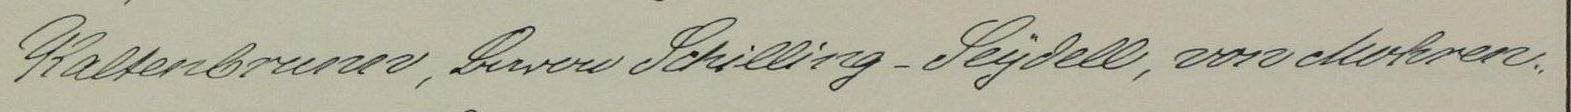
Kaltenbrunn, Baron Schilling-Seydell, von Mohren-
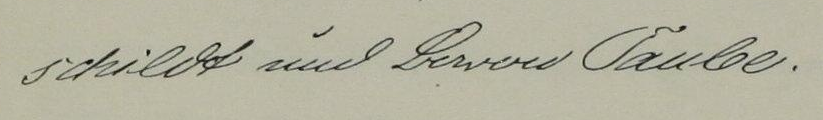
schildt und Baron Taube.
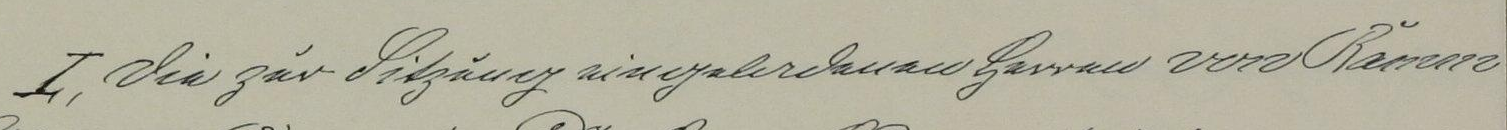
I. Die zur Sitzung eingeladenen Herren von Ramm-
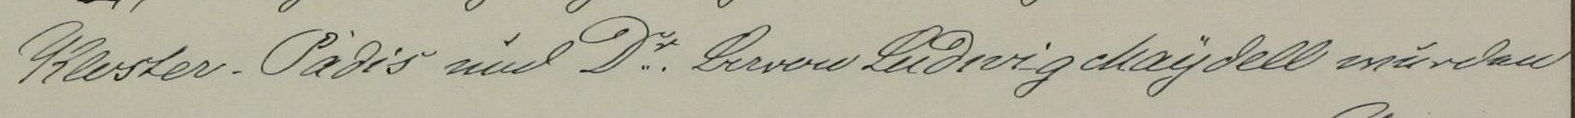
Kloster-Padis und Dr. Baron Ludwig Maydell wurden
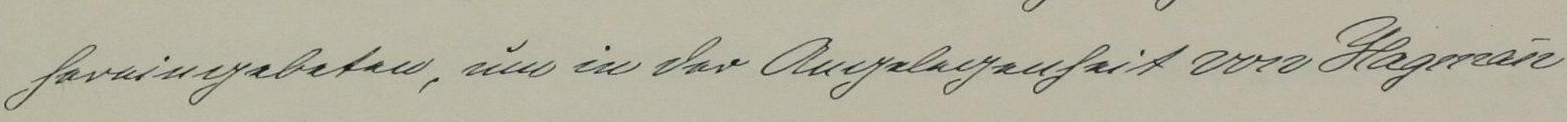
hereingebeten, um in der Angelegenheit von Hagmann
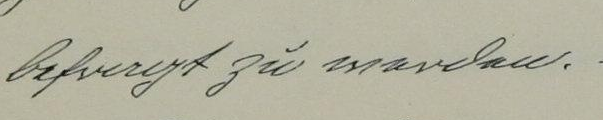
befragt zu werden.
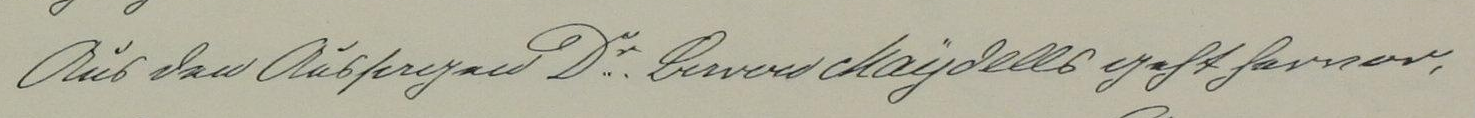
Aus den Aussagen Dr. Baron Maydells geht hervor,
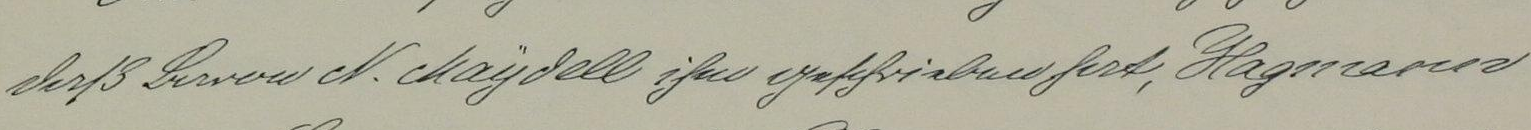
daß Baron N. Maydell ihm geschrieben hat, Hagmann
